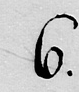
6.
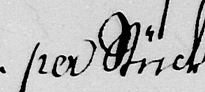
zelne Stücke
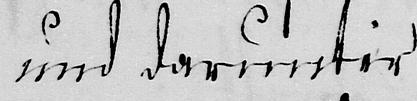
und darunter
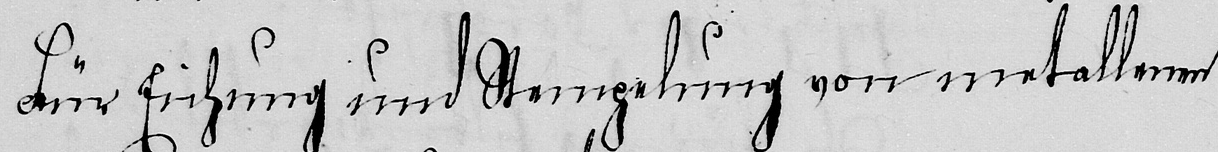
Für Eichung und Stempelung von metallenen
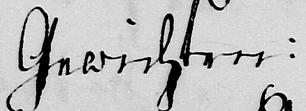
Gewichten:
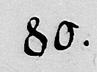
30.
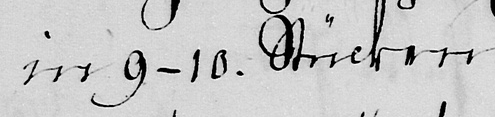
in 9–10. Stücken
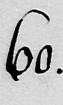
60.
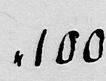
100.
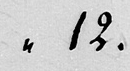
12.
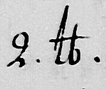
3. lb.
